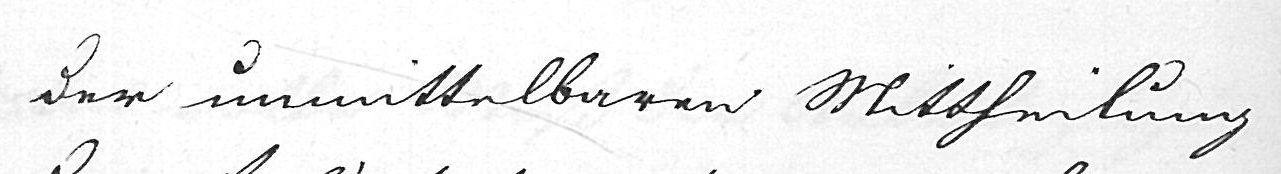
der unmittelbaren Mittheilung
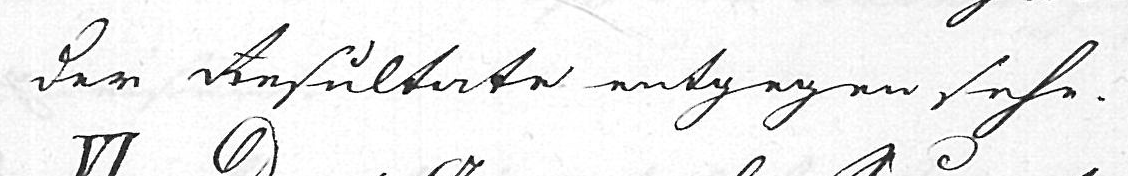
der Resultats entgegen sehe.
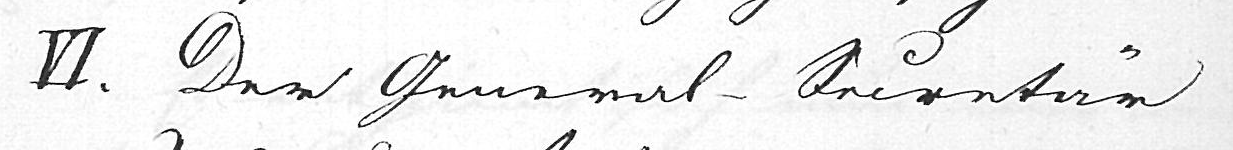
VI. Der General-Secretär
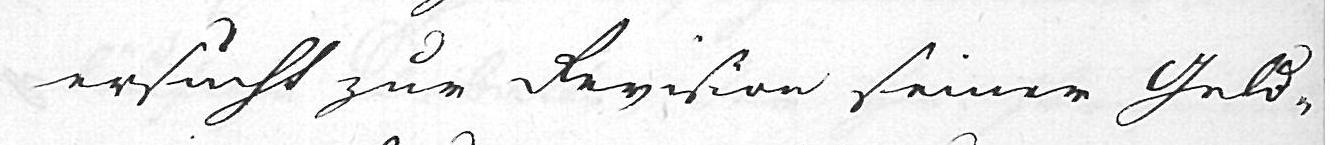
ersucht zur Revision seiner Geld-
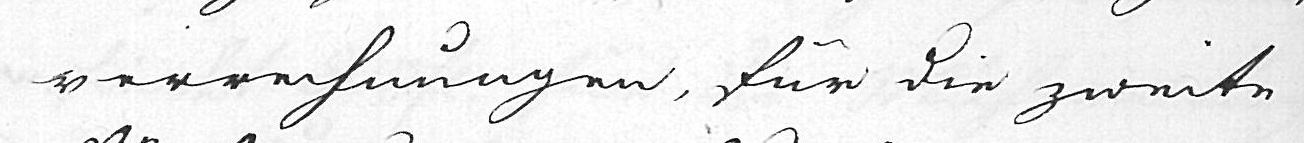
verrechnungen, für die zweite
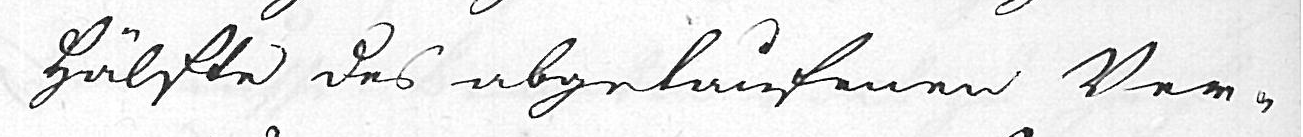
Hälfte das abgelaufenen Ver-
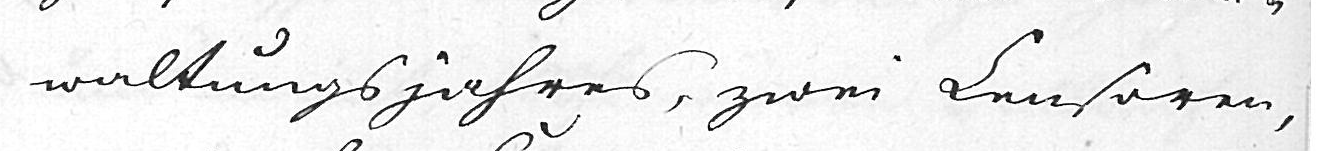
waltungsjahres, zwei Censoren,
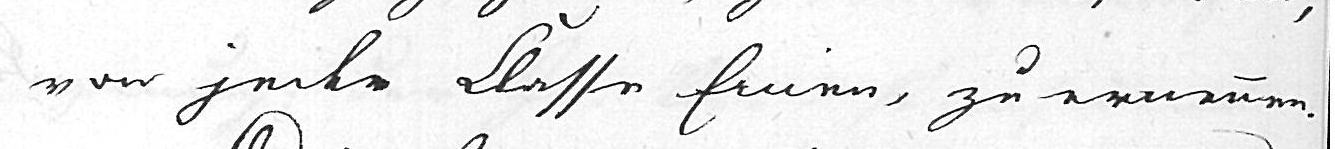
von jeder Classe Einen, zuernennen.
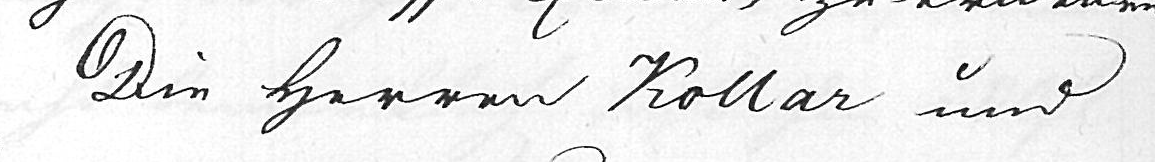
Die Herren Kollar und
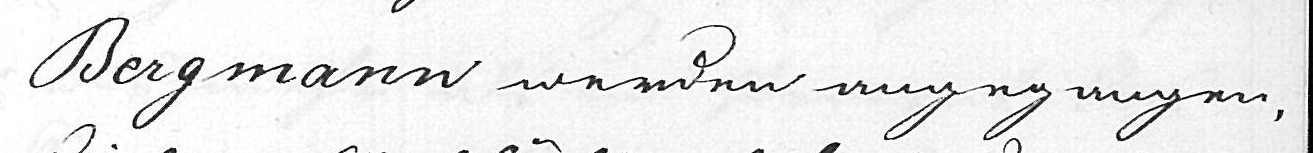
Bergmann werden angegangen,
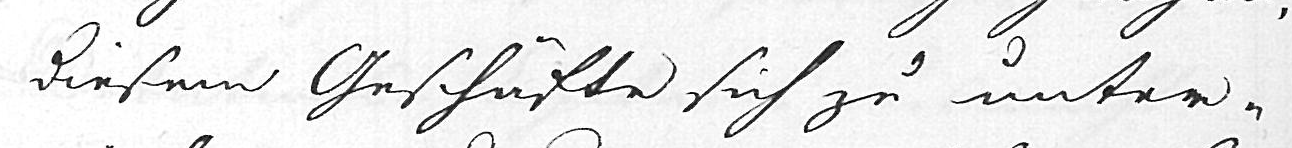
diesem Geschäfte sich zu unter-
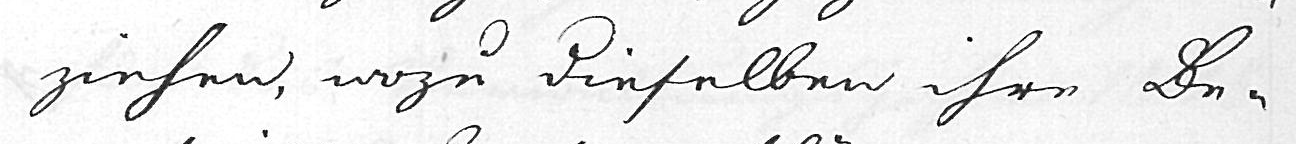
ziehen, wozu dieselben ihre Be-
